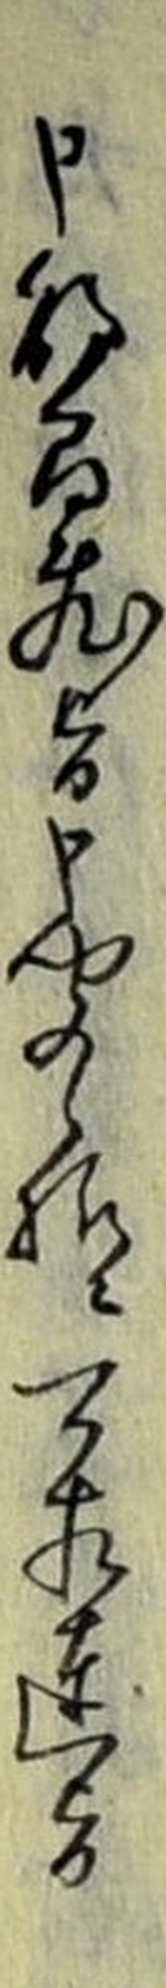申触間敷旨申聞候様ニ可相達旨
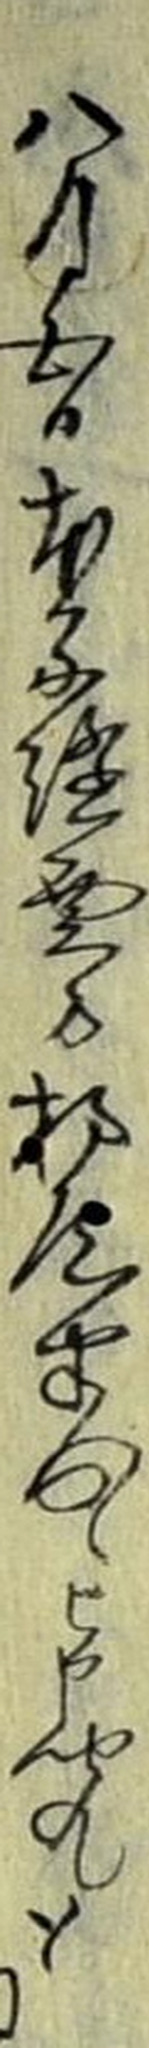八月五日本多縫殿方栃屋半右衛門へ被申聞候〆
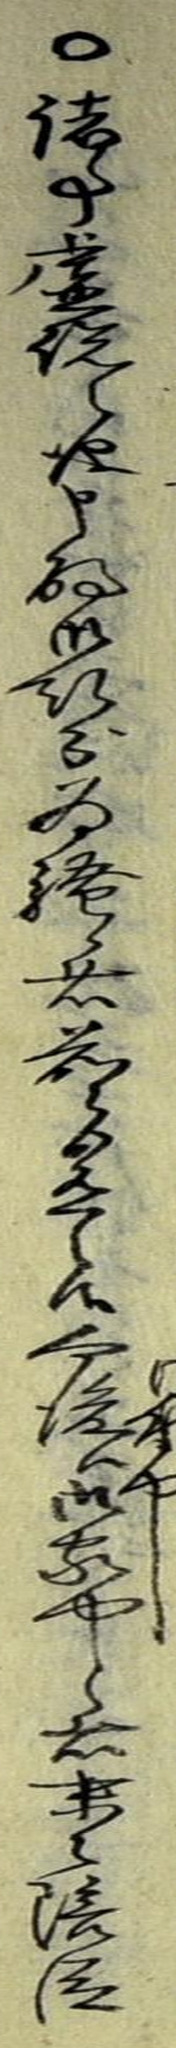〇諸事虚説之儀申触御領分為騒候者前々ゟ有之候向後ハ御家中之者末之陪臣

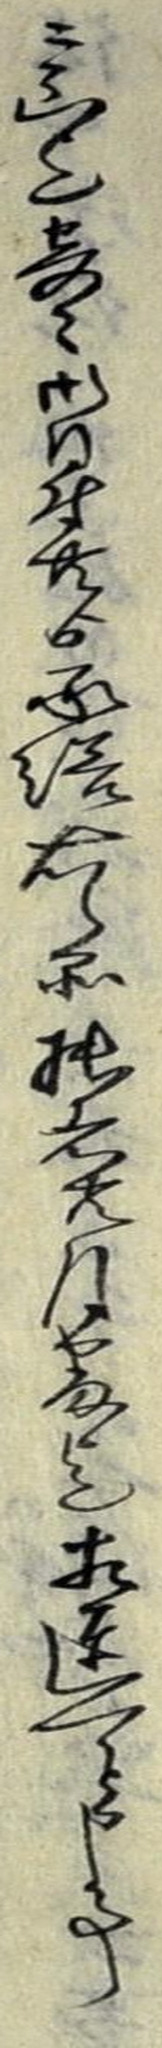ニ至迄寄々御目付共ゟ承繕右之品能者共月番迄相達可被申事
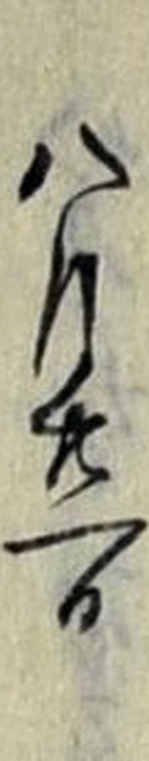八月廿一日
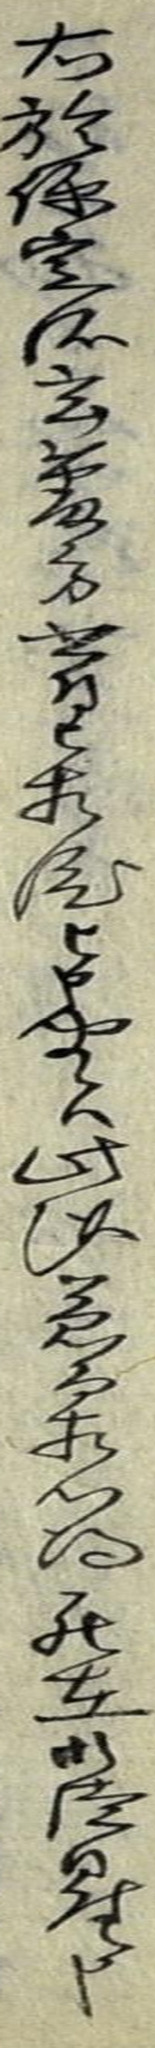右於評定所玄蕃方書付被相渡被申聞候ハ此趣兼而相心得罷在御徒目付へ申
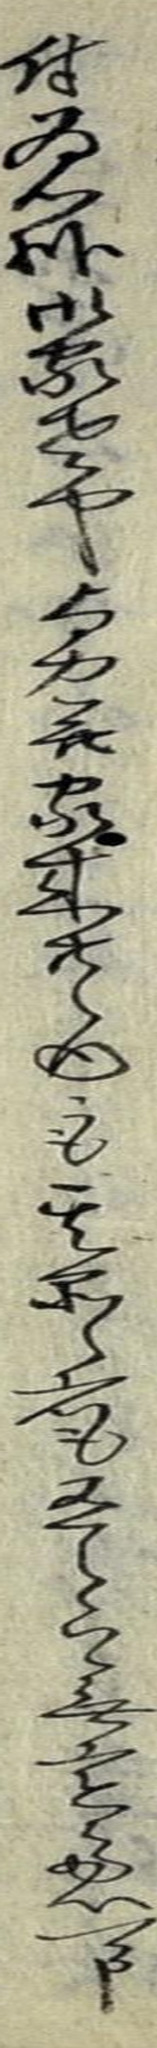付為心掛御家老中与力并家来共之内ニも其品之者も有之候ハヽ無遠慮可申
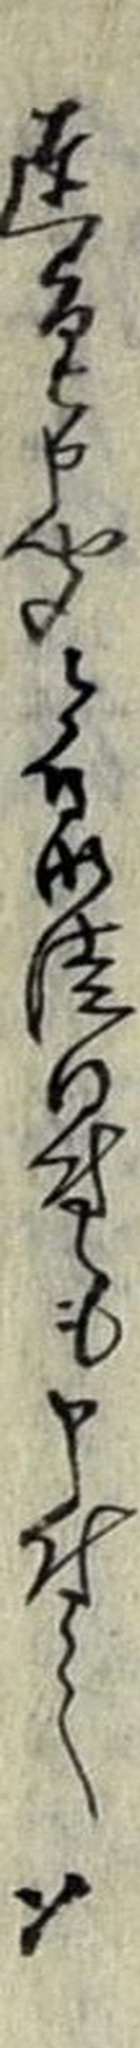達旨被申聞候ニ付御徒目付へも申付之〆
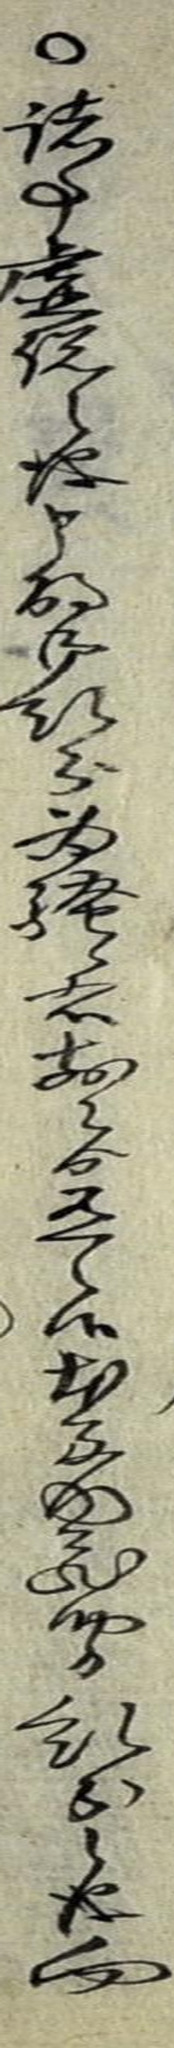〇諸事虚説之儀申触御領分為騒候者前々ゟ有之候本多内蔵助方領分之儀向
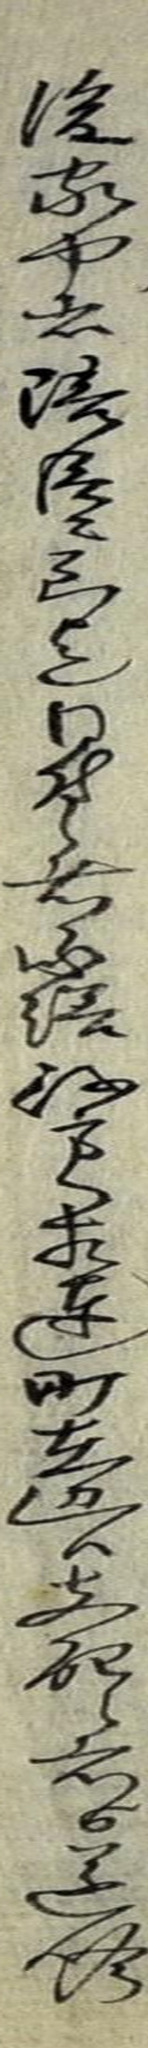後家中者陪臣ニ至迄目付之者承繕役方へ相達町在辺ハ支配之者ゟ遂吟
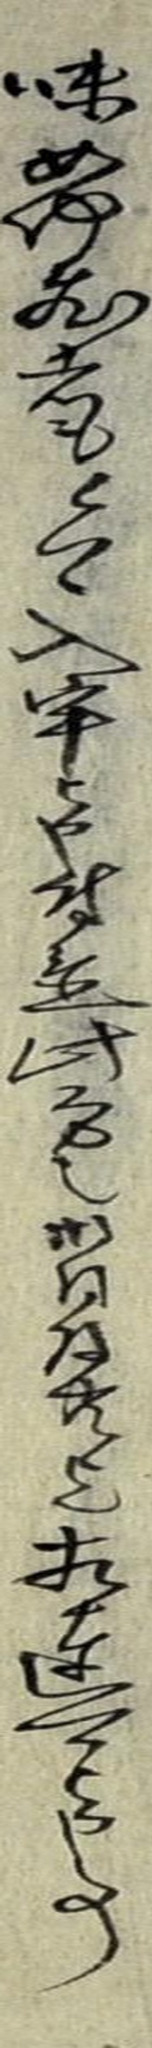味如何敷者も候ハヽ入牢被申付置此方之御目付共迄相達可被申事
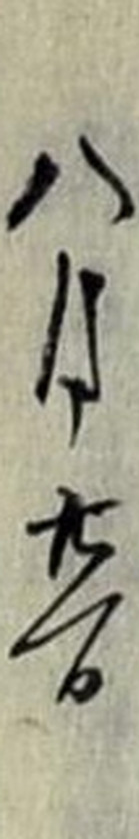八月廿一日
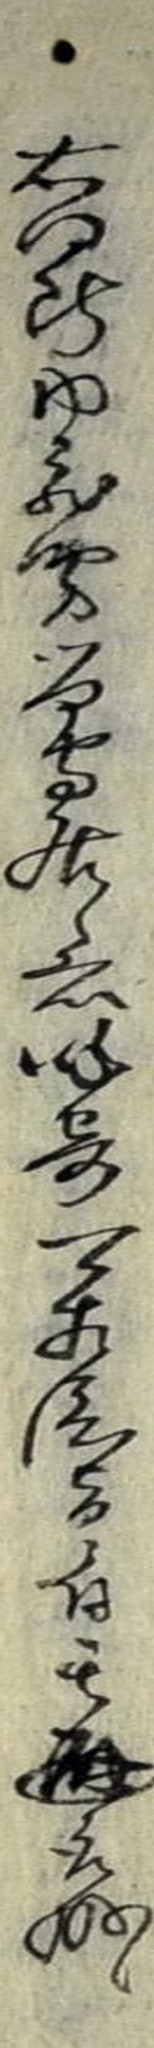右同断内蔵助方留守居之者呼寄可相渡旨ニ付其通取扱候
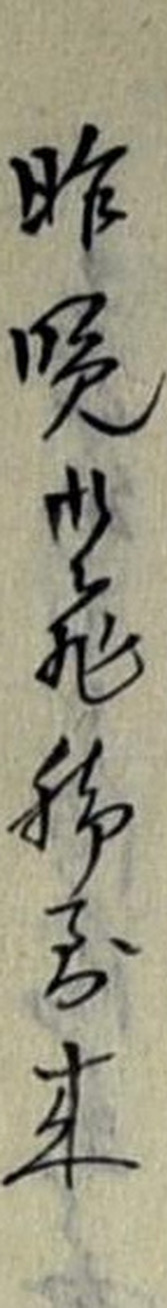昨晩御飛脚到来
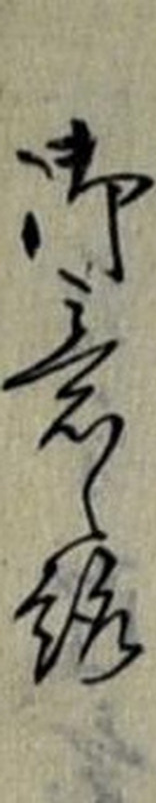御意之趣
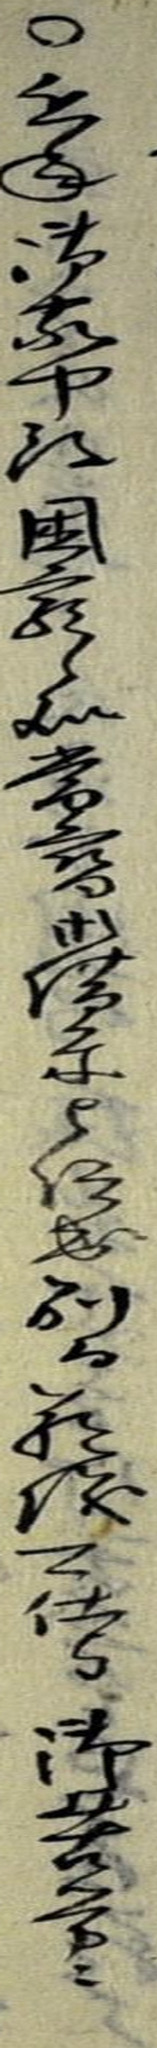〇近年御家中致困窮候処当暮御借米被仰出別而難儀可仕与御苦労ニ
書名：命令之部 一
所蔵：福井県文書館 Fukui Prefectural Archives
